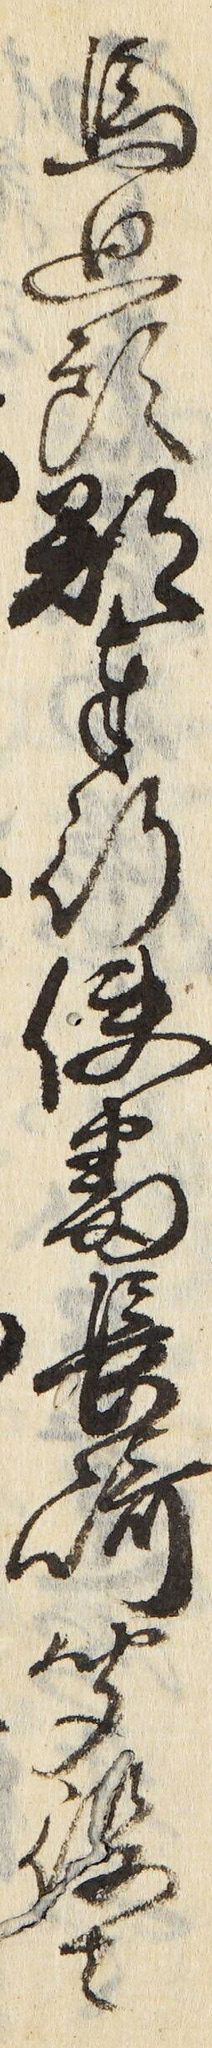馬廻頭郡奉行使番長崎聞役者
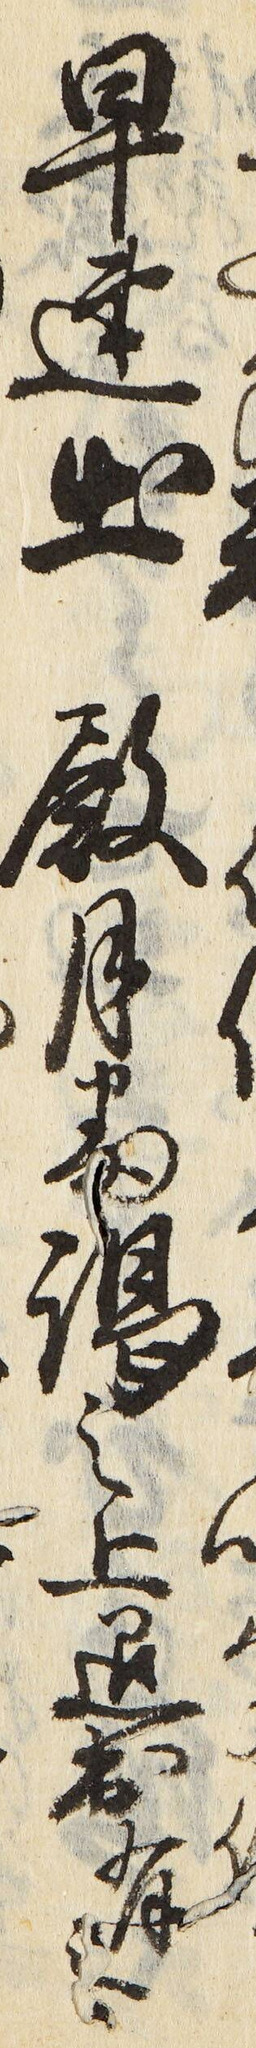早速出殿月番謁之上退出有之
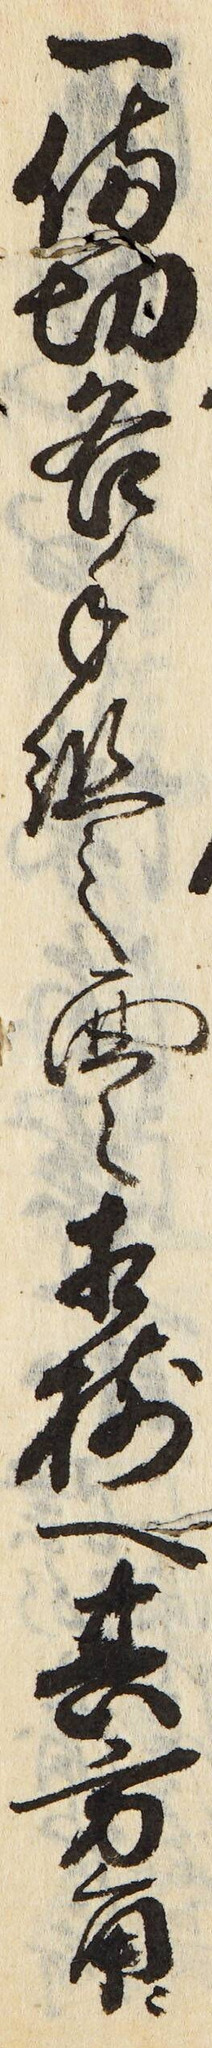一備切各手組之面々相揃へ其方角ニ

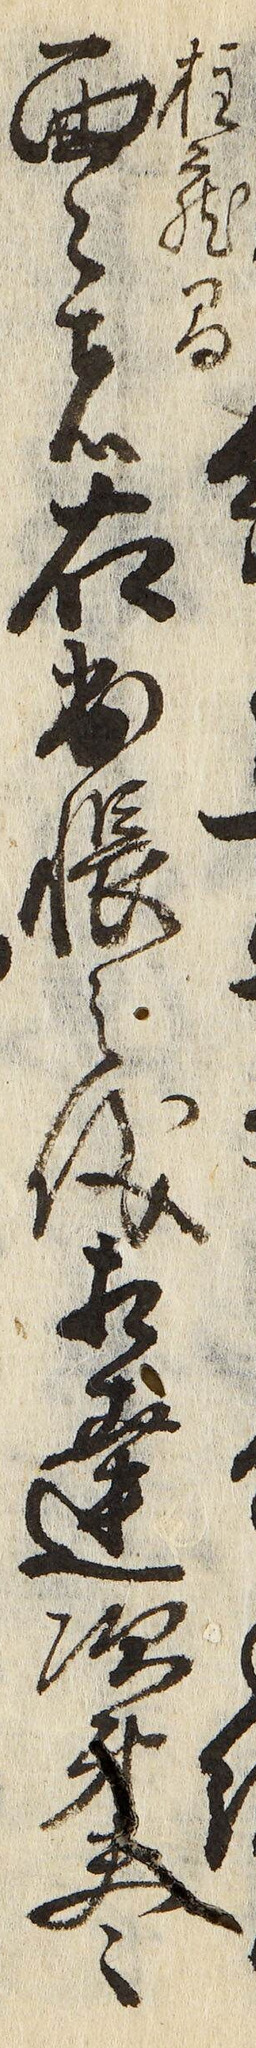面々者右出張之儀相達次第夫々
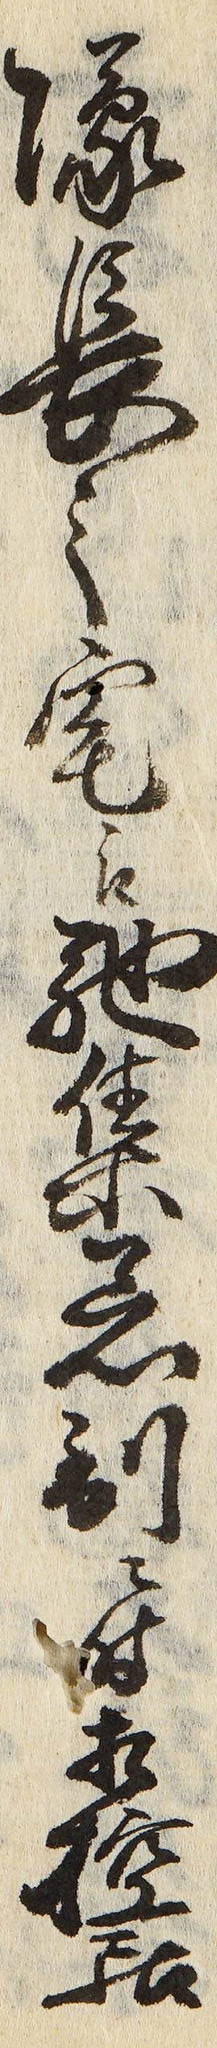隊長之宅江馳集着到ニ付相控居
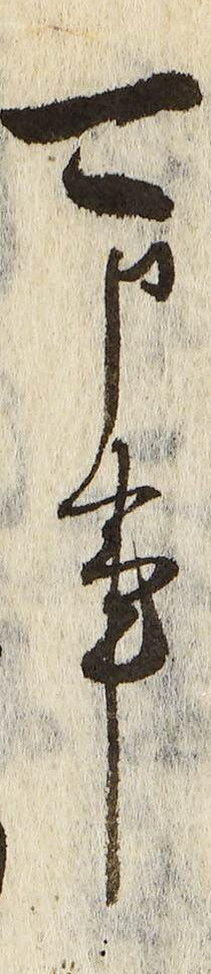可申事
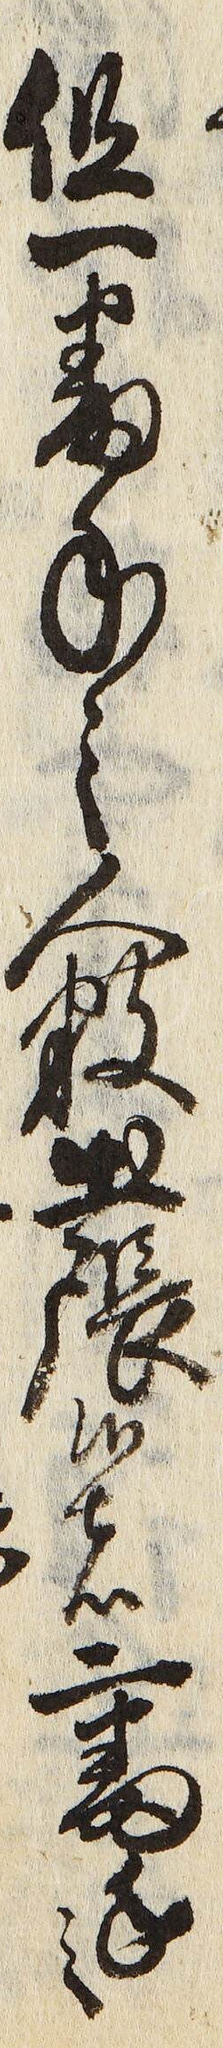但一番手之人数出張候者二番手之
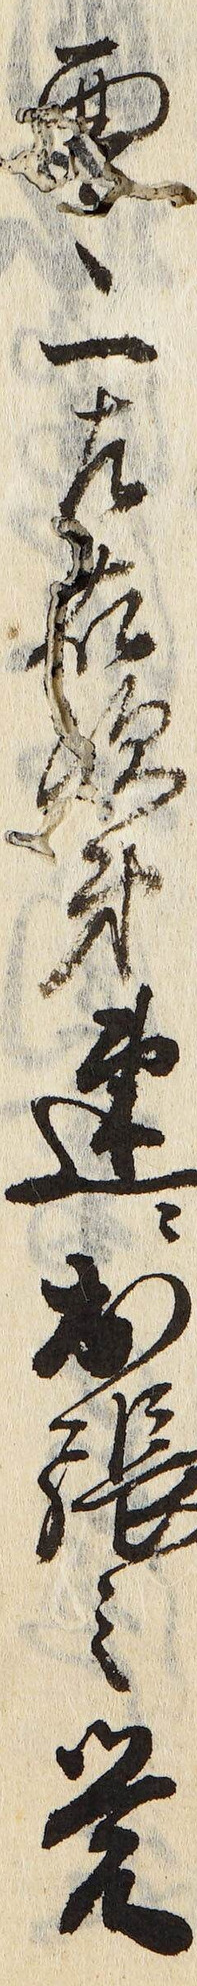面々一左右次第速ニ出張之覚
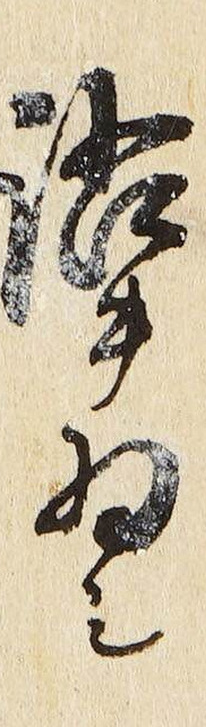語ヲ為シ
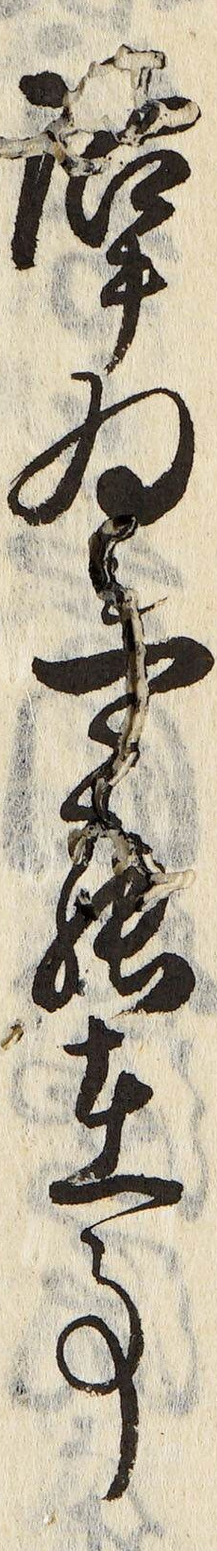語ヲ為シ可罷在事
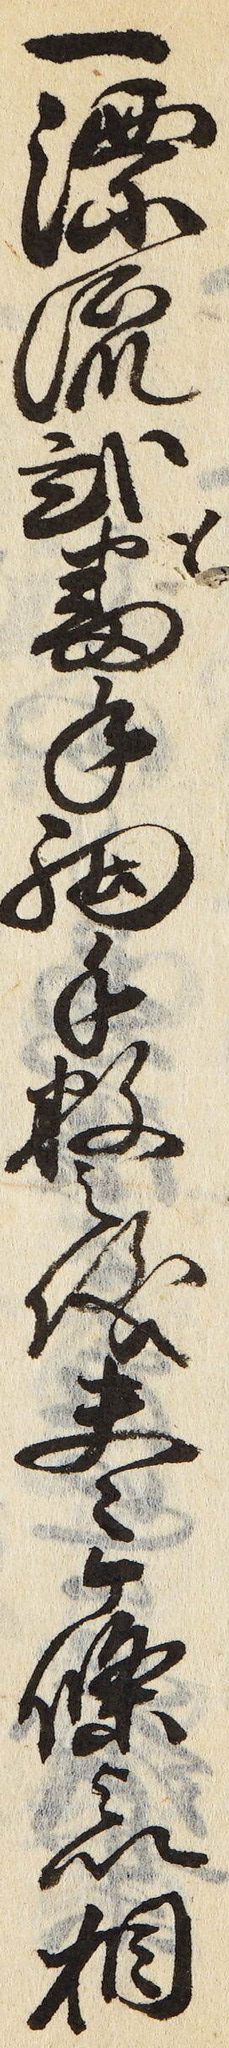一漂流弐番手綱手数之儀夫々ケ条与以相
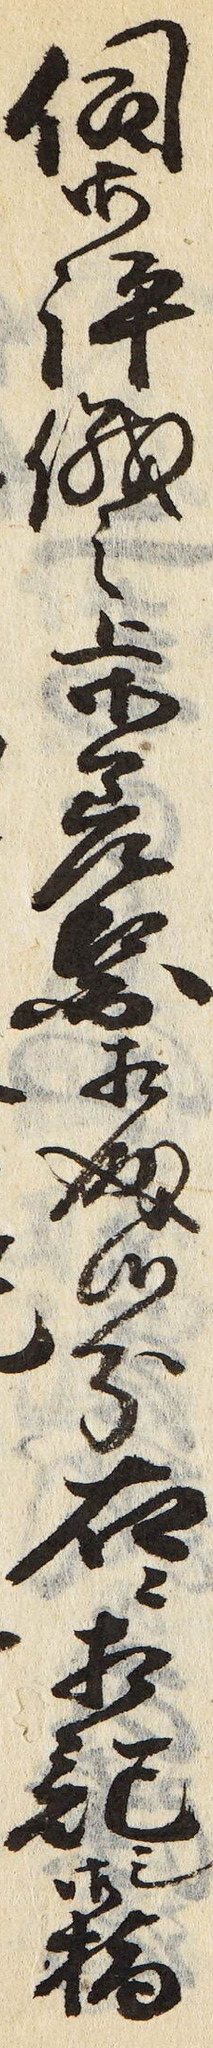伺御評儀之上御差図相成候分右ニ相記シ御指
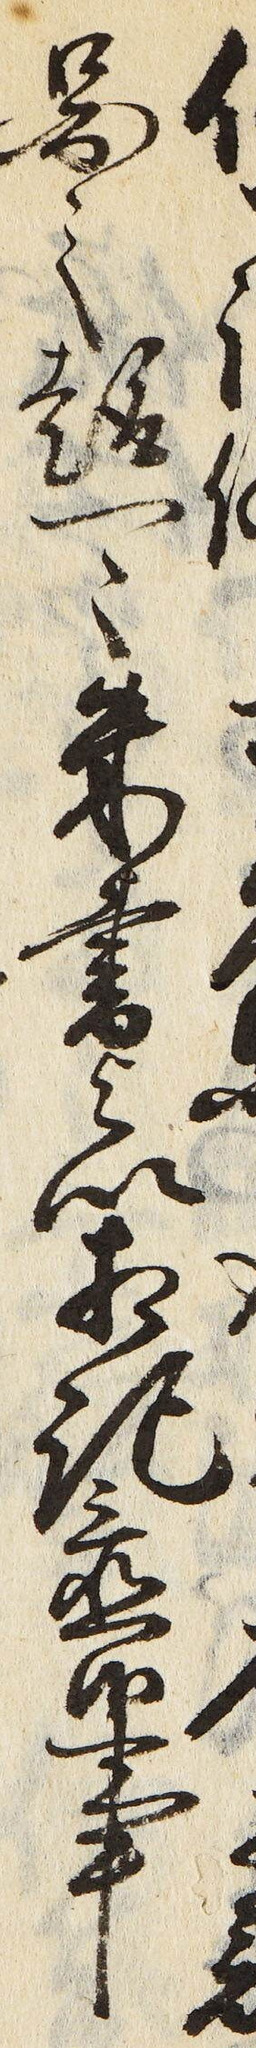図之趣一々朱書与以相記置候事
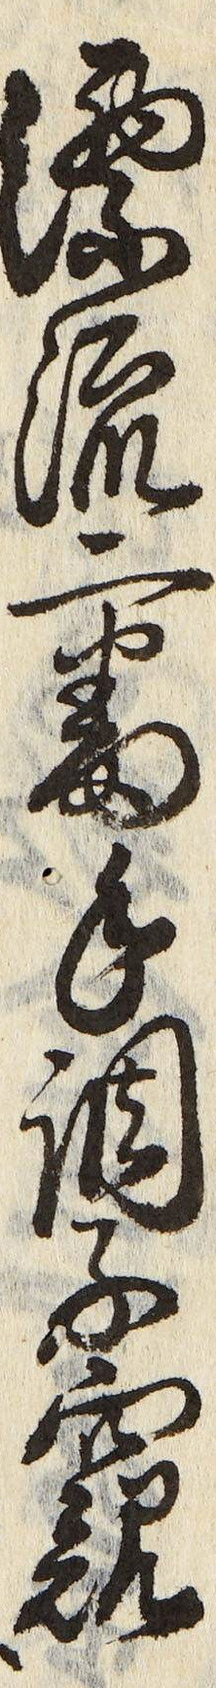漂流二番手調子窺
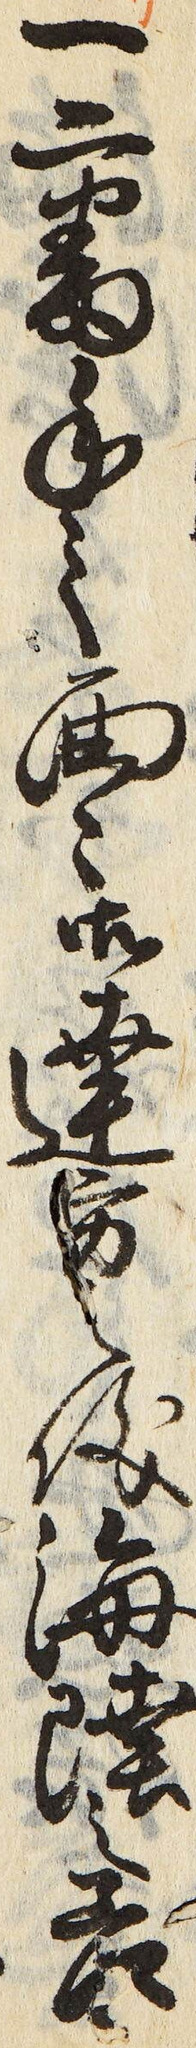一二番手之面々御達方之儀海陸之着
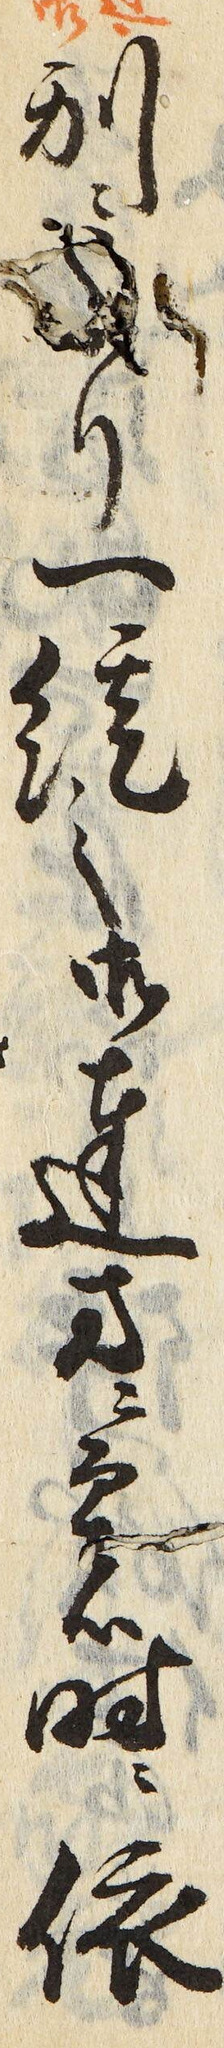別ニり一統之御達方ニ而者時ニ依
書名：御領海江異国船漂流有之節御手当之次第大組頭心得之廉々書集記
